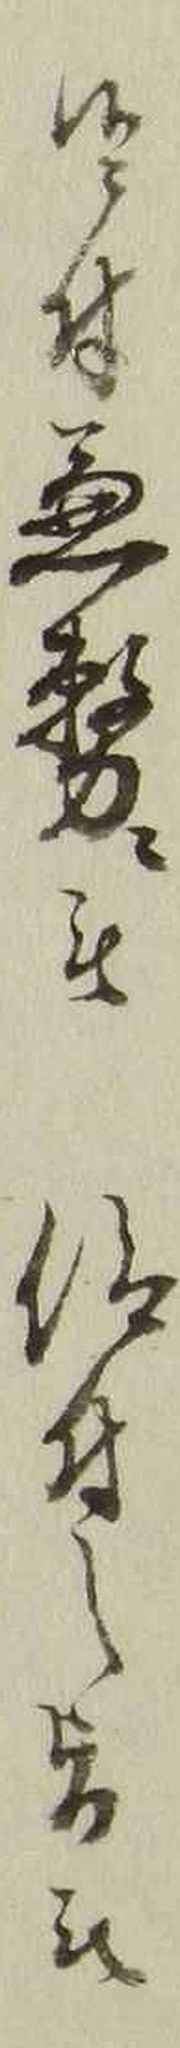候ニ付兼務ニ被仰付之旨被
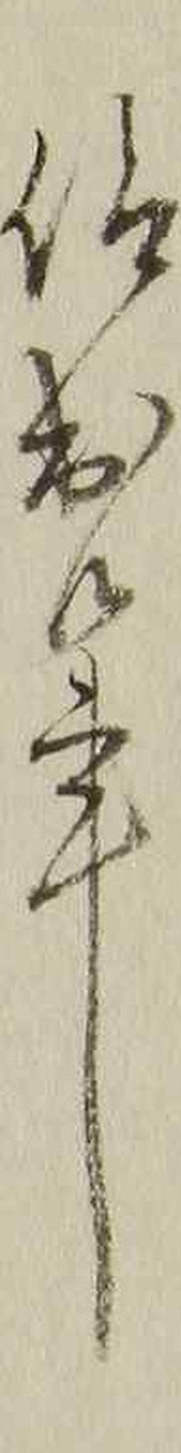仰出候事
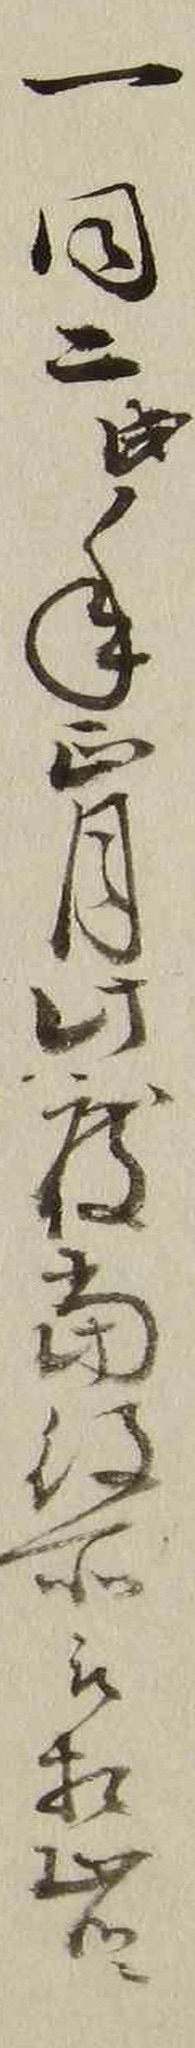一同二戊年正月此度当役所被相出候ニ
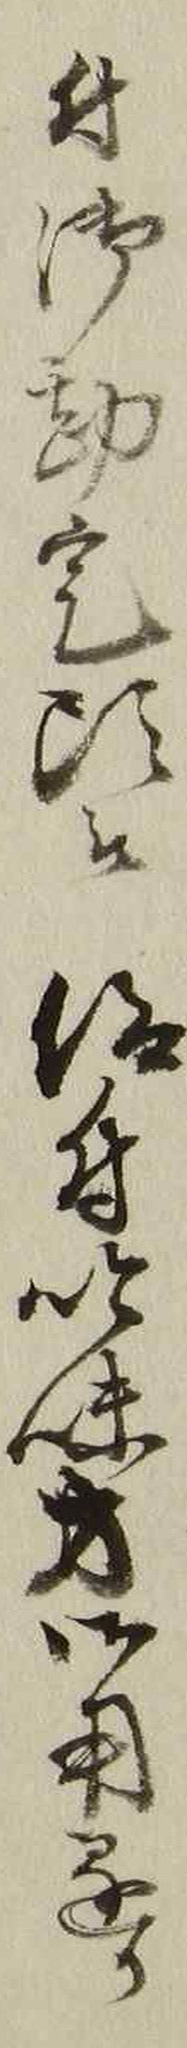付御勘定頭被仰付吟味方御用懸り
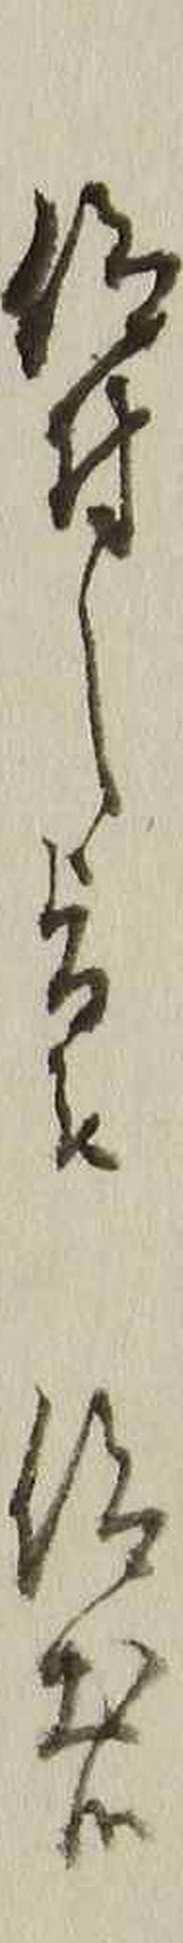被仰付之旨被仰出候
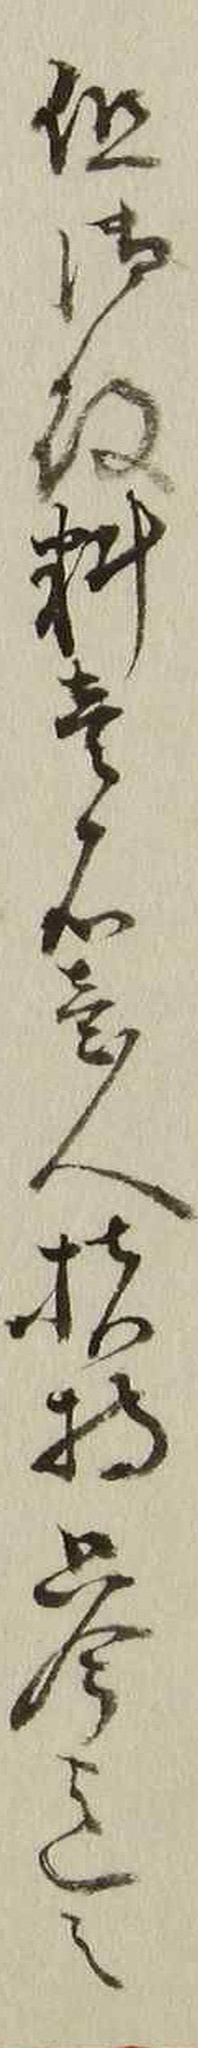但御役料壱石壱人扶持只今迄之
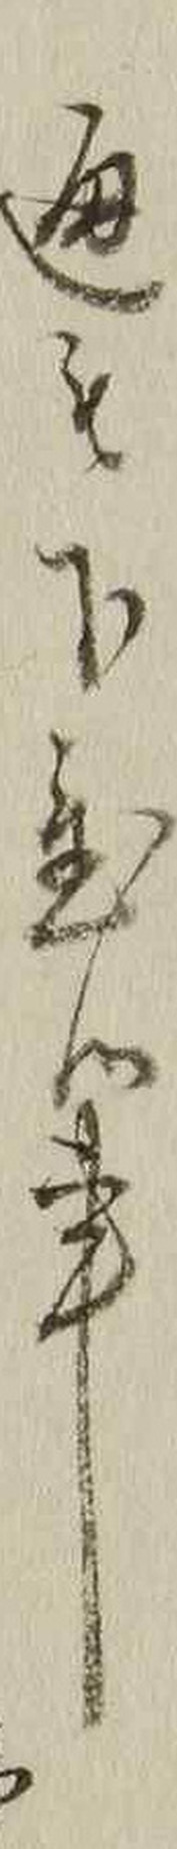通被下置候事
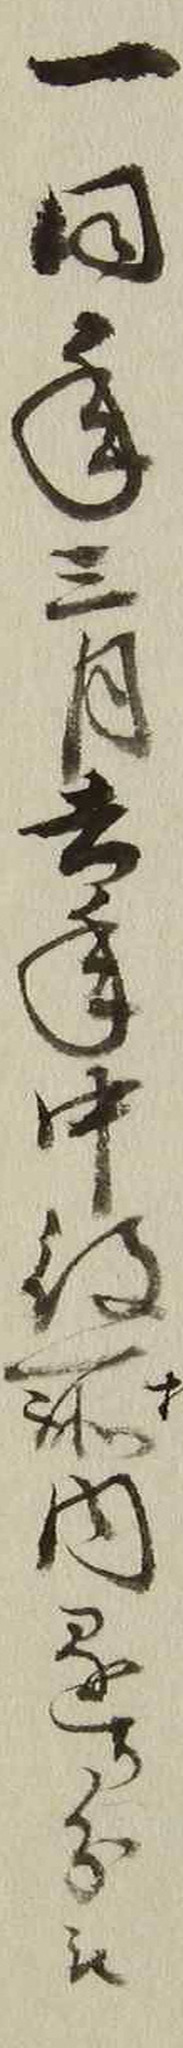一同年三月去年中役所内懸分り被
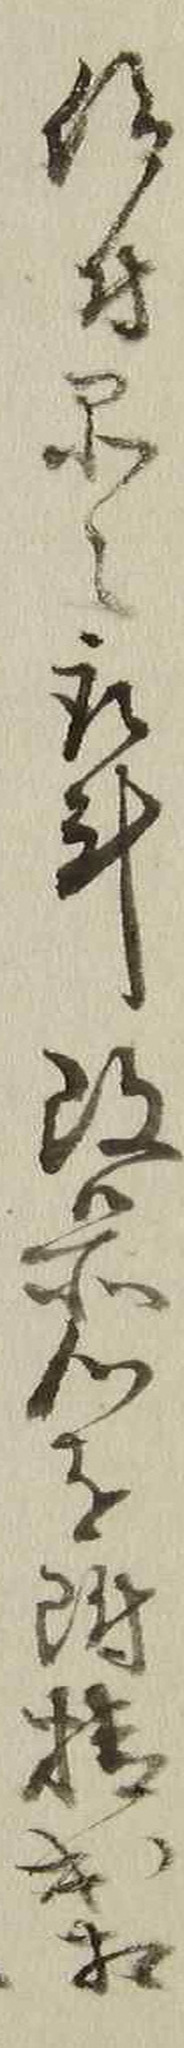仰付品々取計改候所心を附精出相
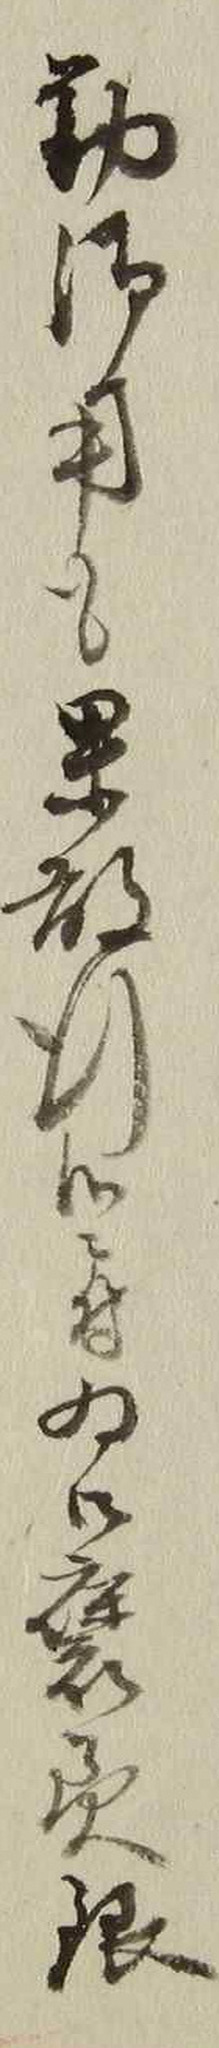勤御用も果敢行候ニ付為御褒美銀
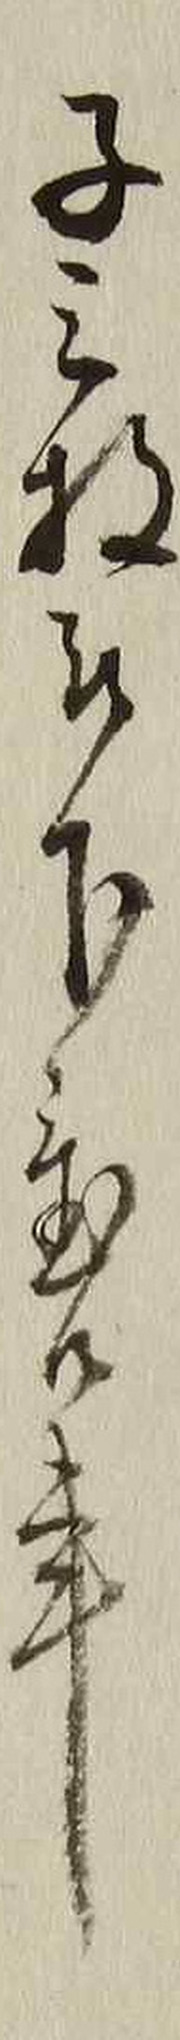子三枚被下置候事
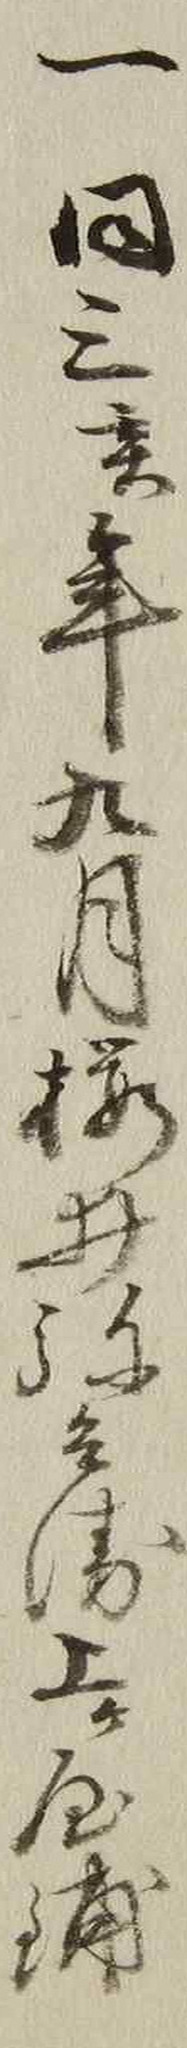一同三亥年九月桜井弥兵衛上ヶ屋鋪
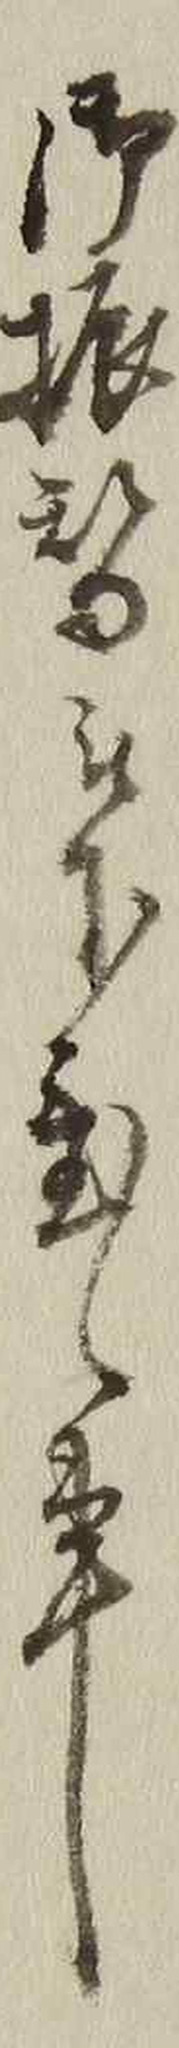御振替被下置候事
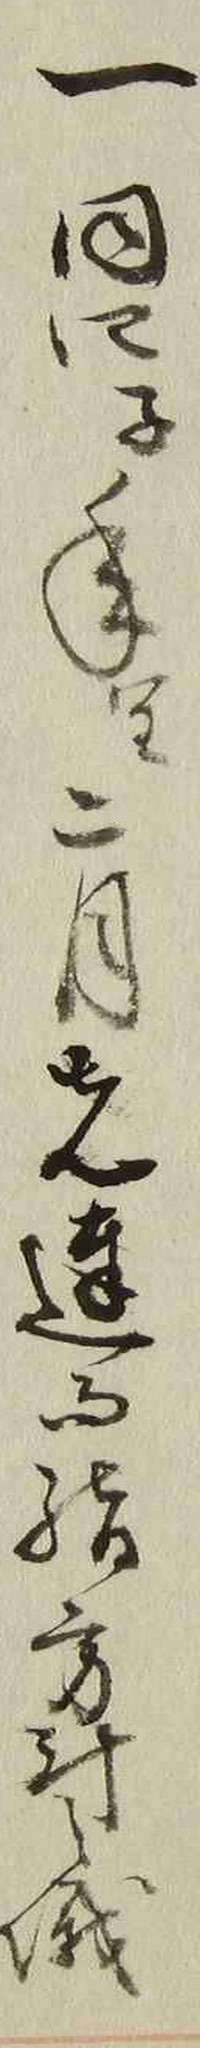一同四子年閏二月先達而絹方計之儀
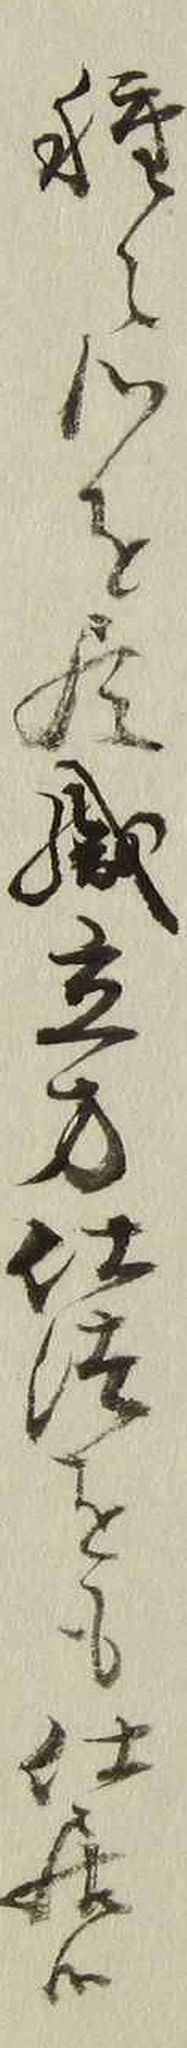種々心を尽織立方仕法をも仕居候
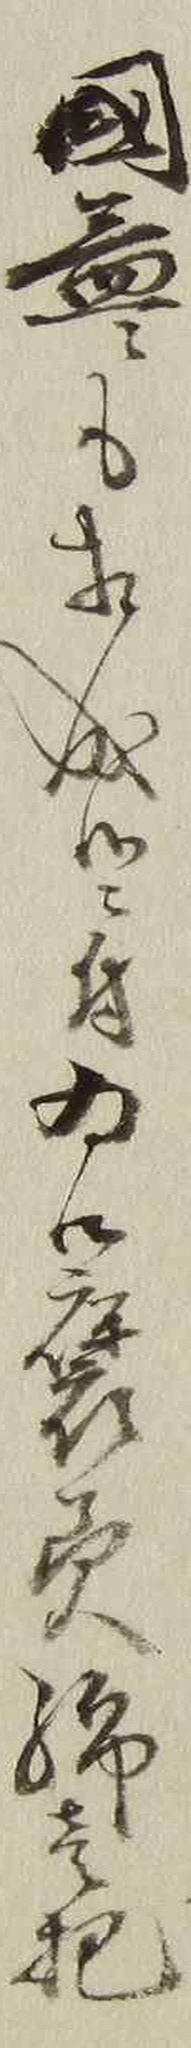国益ニも相成候ニ付為御褒美綿壱把
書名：諸士系譜　巻之36　は之部4
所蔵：会津若松市立会津図書館
